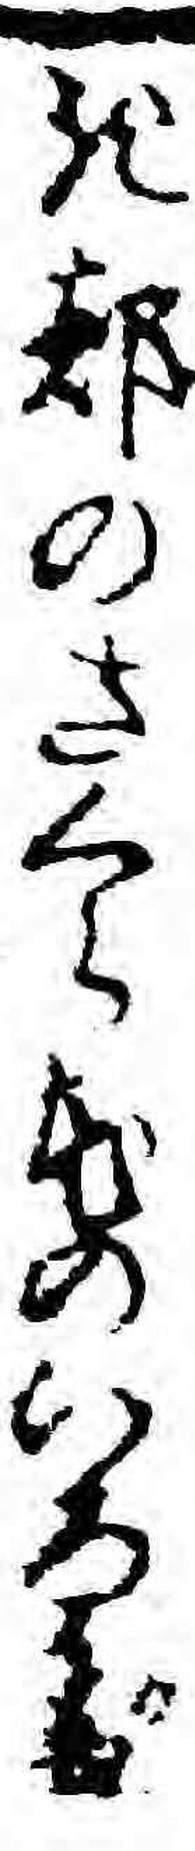き都のさくら花のいろ香
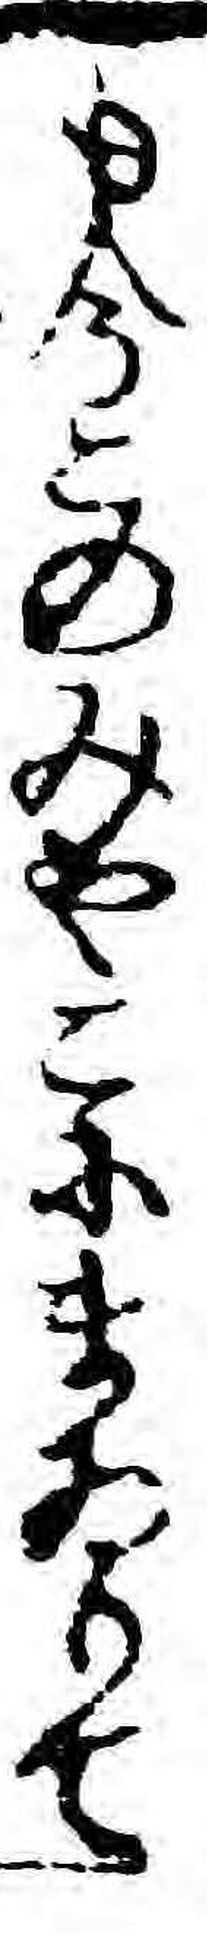も今このみやこにまゐりて
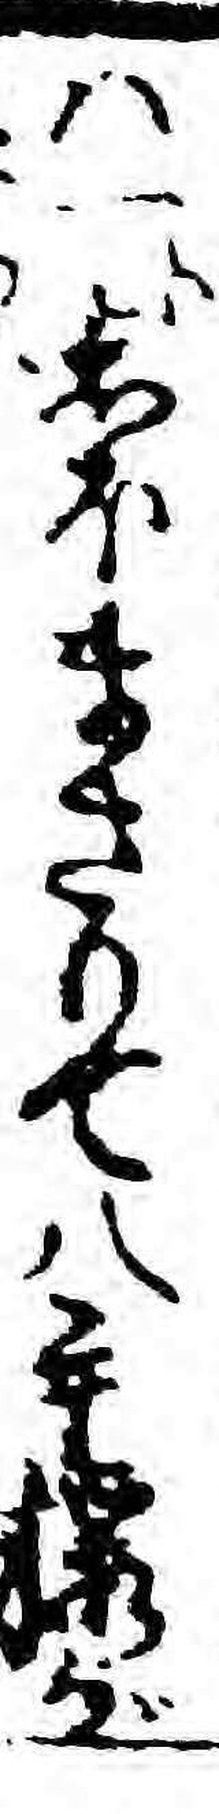は一トしほまさりて八重桜が
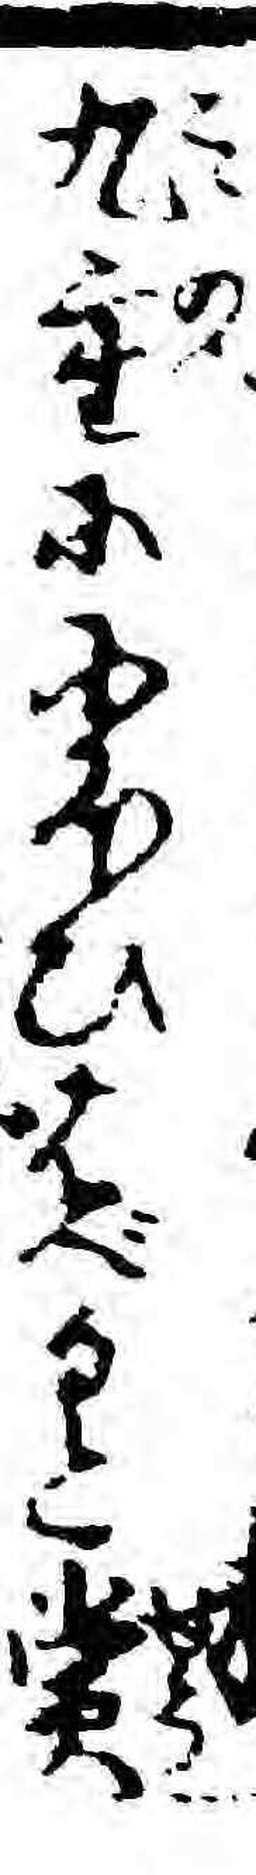九重ににほひはべると賞
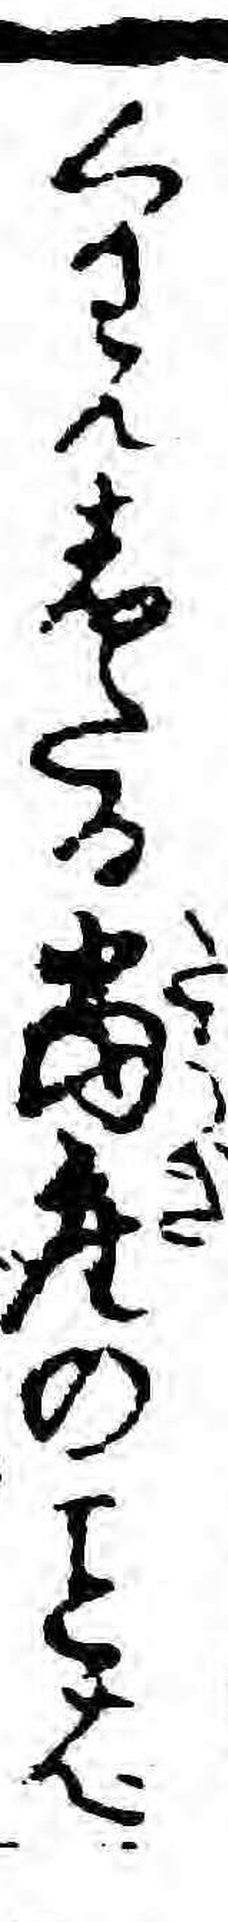くわんしたる当座のことば
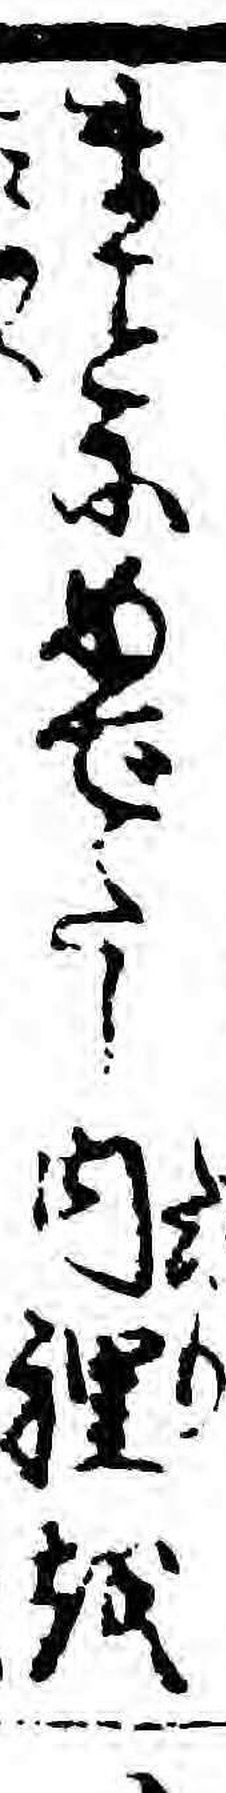まことにめでたし内裡を
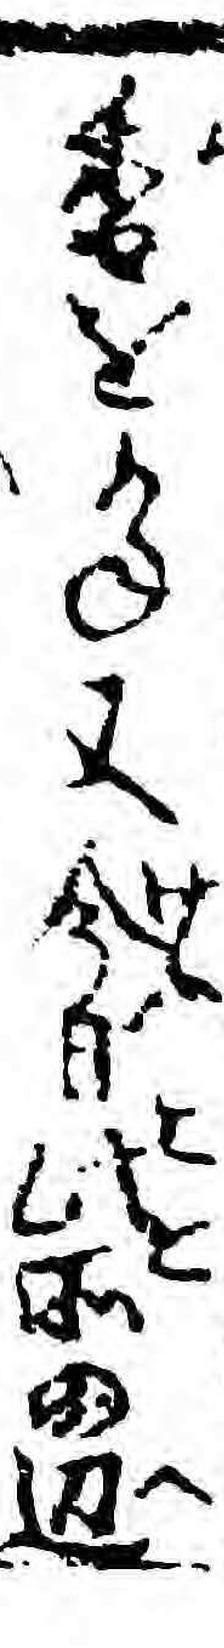香をかね又今日此所の辺
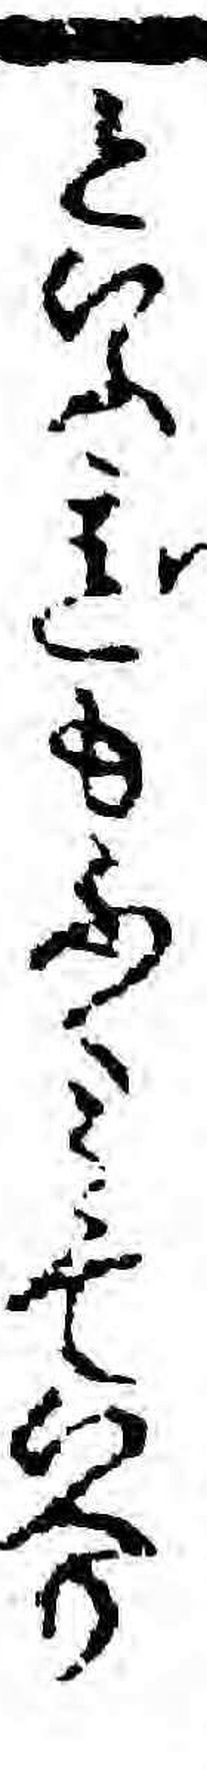といふ意もふくみていへり

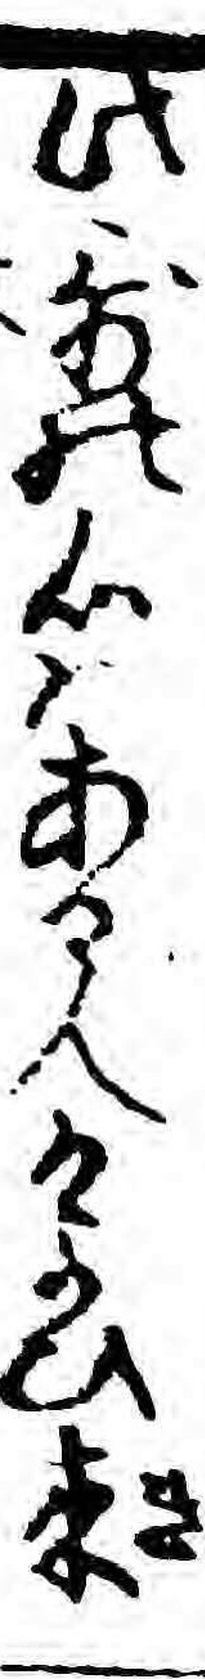此哥の心はある人かよひ来
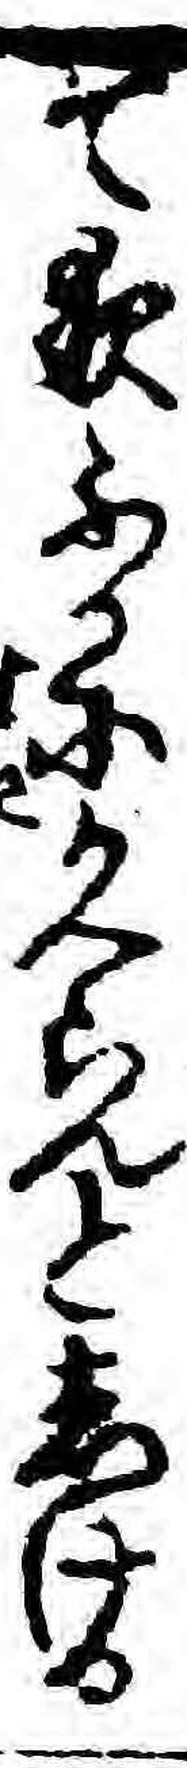て夜ふかにかへらんとしける
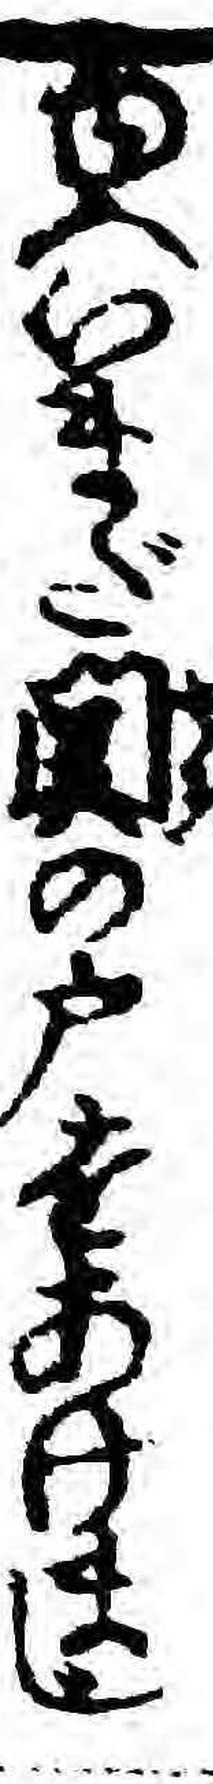ゆへいまだ関の戸をあけまじ
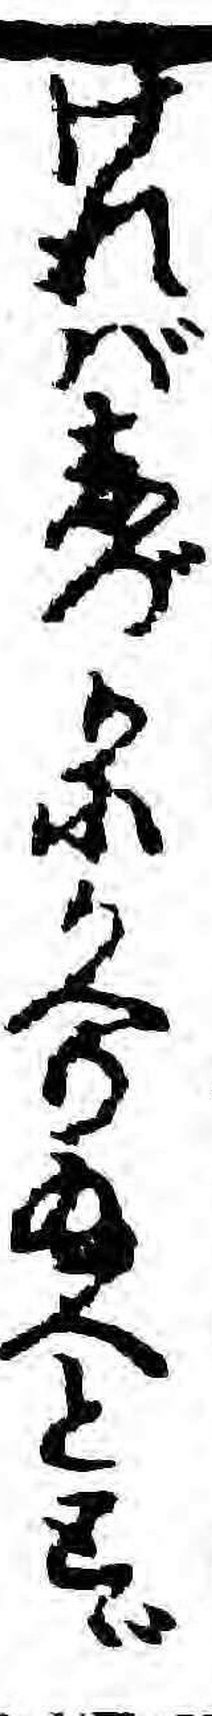ければしづかにかへり給へととゞ
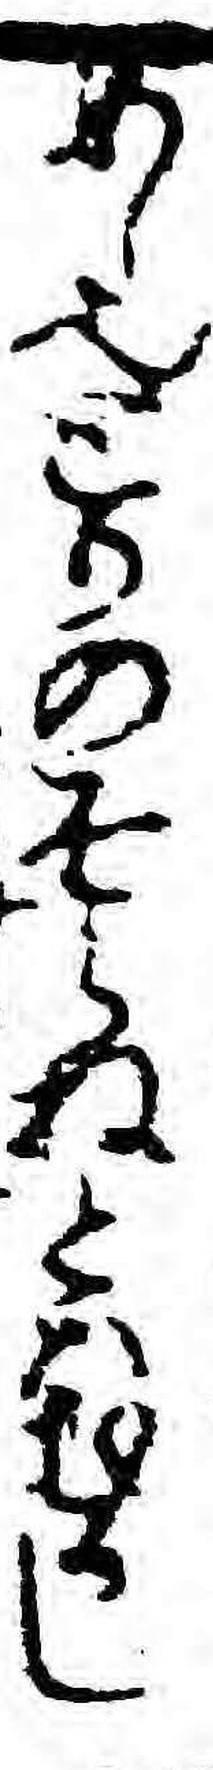めし也とりのそらねとはむかし
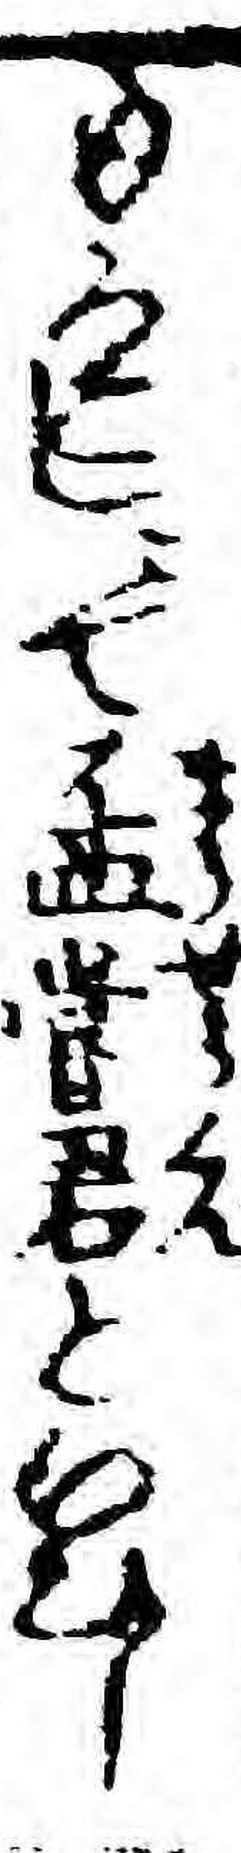もろこしにて孟嘗君といひし
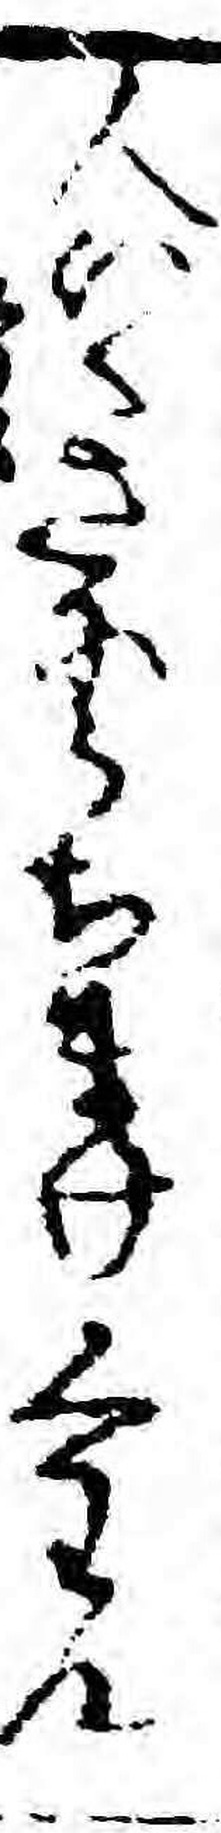人いくさにうちまけくわん
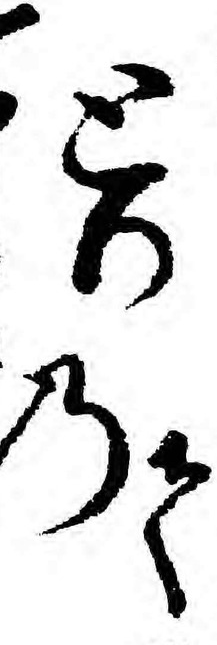とりの
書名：頭書和歌注譯／壽賀多百人一首小倉錦
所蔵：国文学研究資料館
